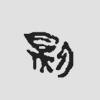則
